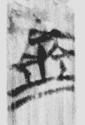齊
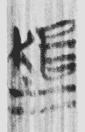𧻚
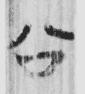公
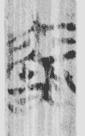{尒䎽}
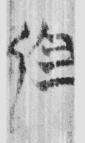於
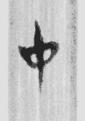中
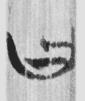曰
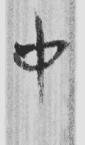中
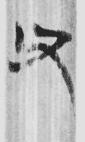父
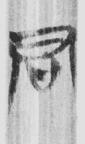君
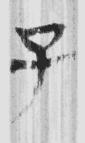子
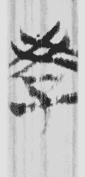𡥈
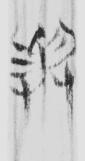與
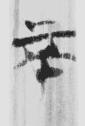不
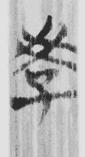𡥈
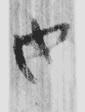女
